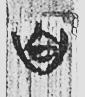自
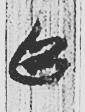𠂤
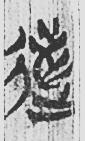逃
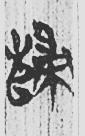{𡴎帚}
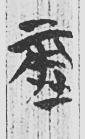坪
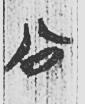公
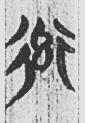率
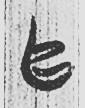𠂤
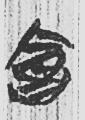會
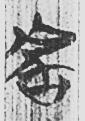者
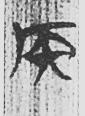侯
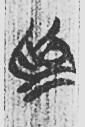爲
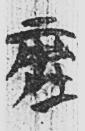坪
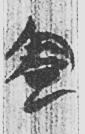侌
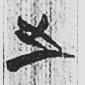之
